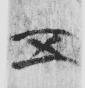五
